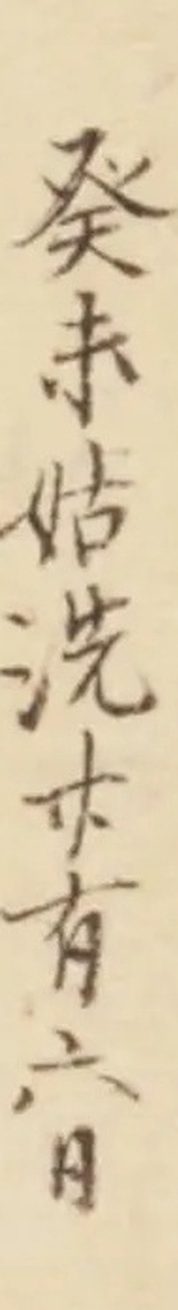癸未姑洗廿有六日
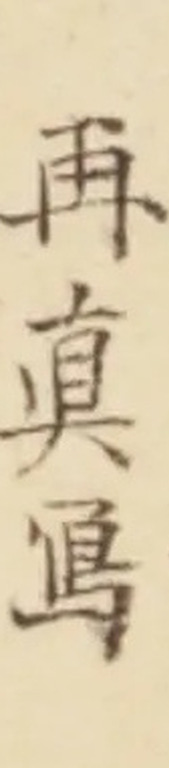再真写
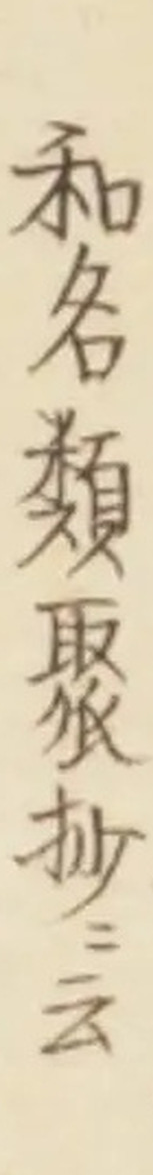和名類聚抄曰
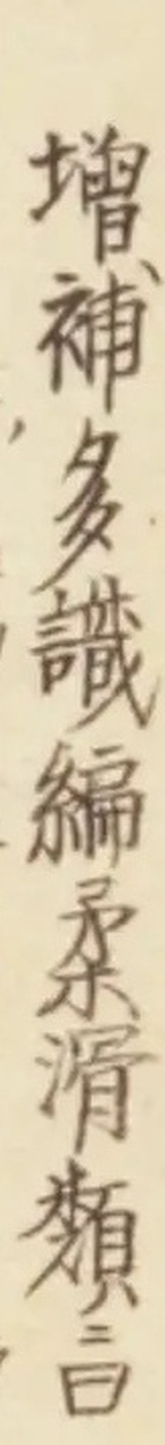増補多識変柔滑類曰
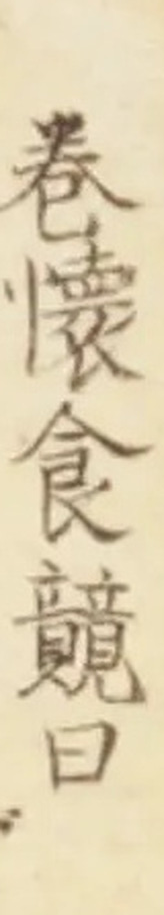巻懐食競曰
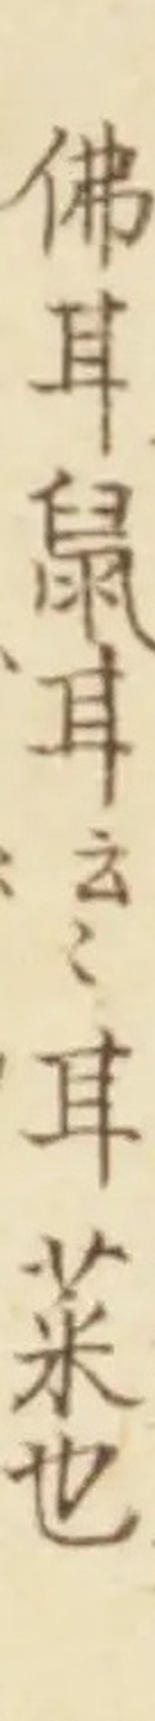仏耳鼠耳云々耳菜也
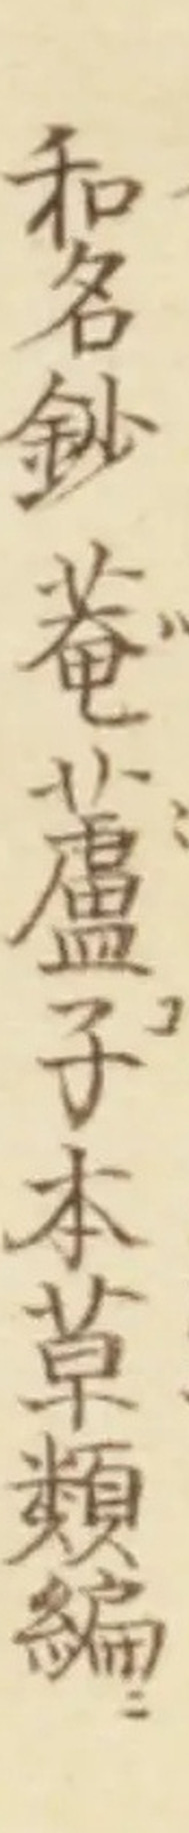和名鈔菴蘆子本草類編
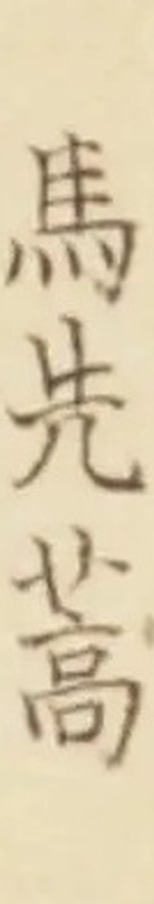馬先蒿
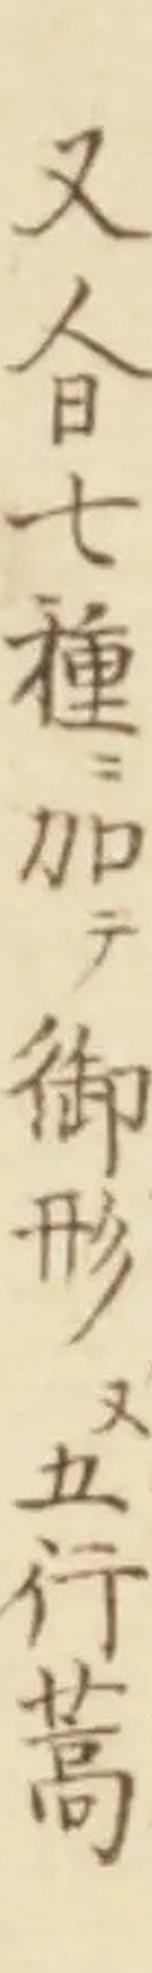又人日七種加御形又五行蒿
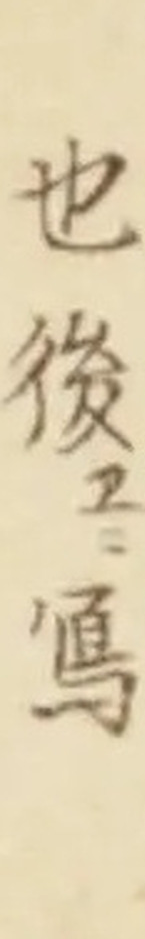也後写
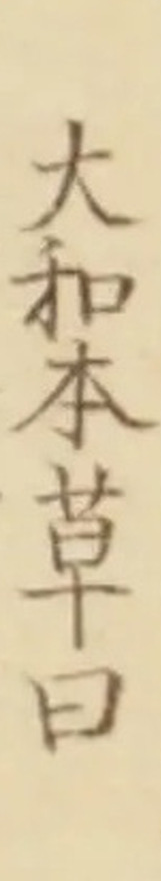大和本草曰
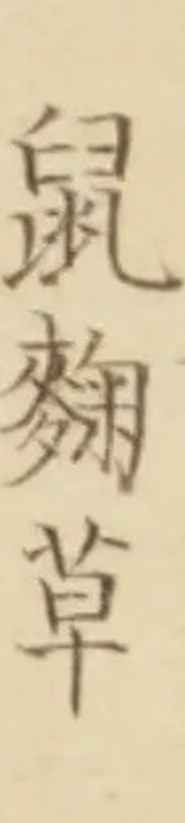鼠麹草
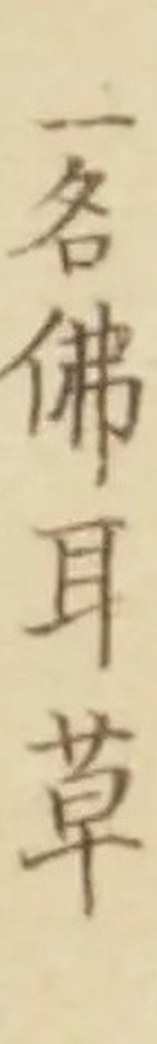一名佛耳草
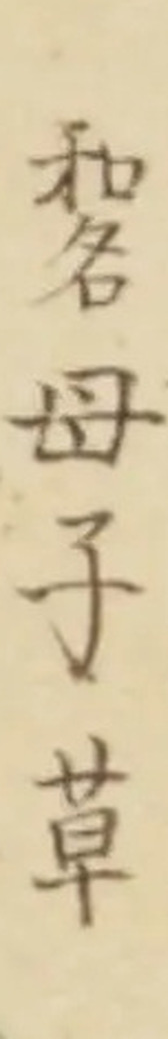和名母子草
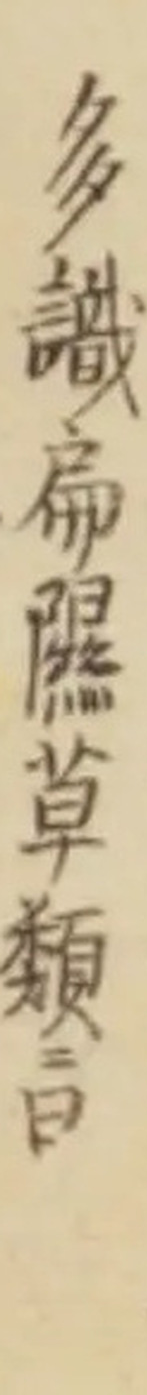多識扁湿草類曰
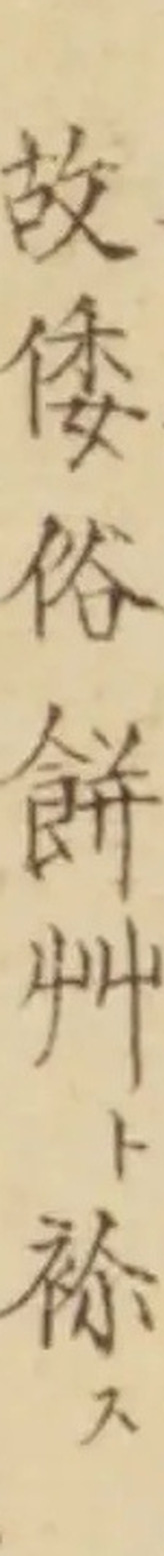故倭俗餅艸称
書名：梅園草木花譜春之部. 1
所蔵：国立国会図書館 National Diet Library, JAPAN
